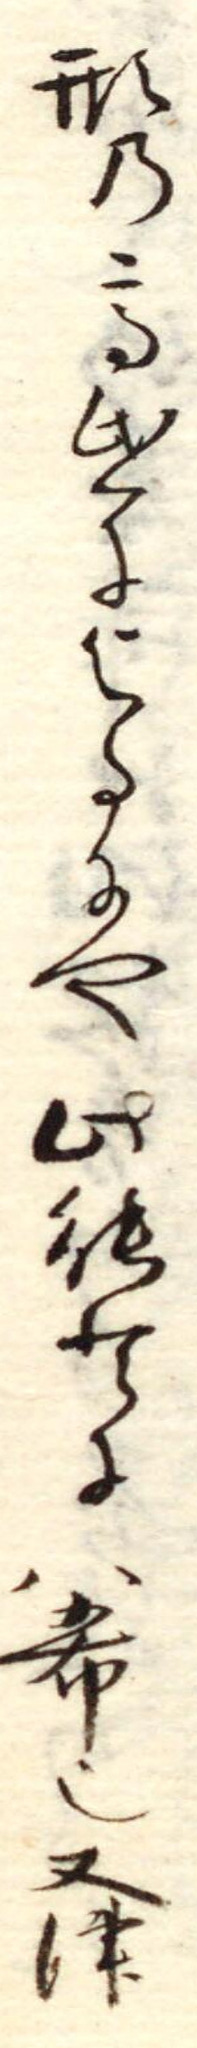形の高低によるにや此能登には希也又津
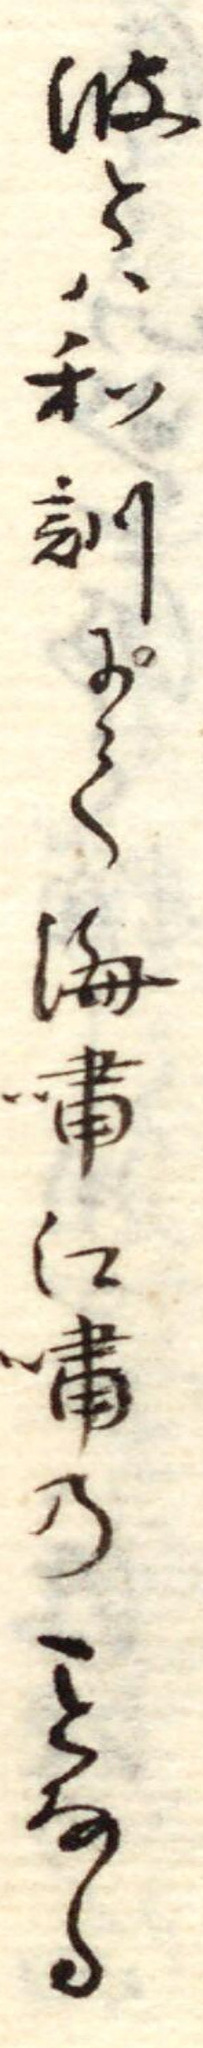波とは和訓にて海嘯江嘯のことなる
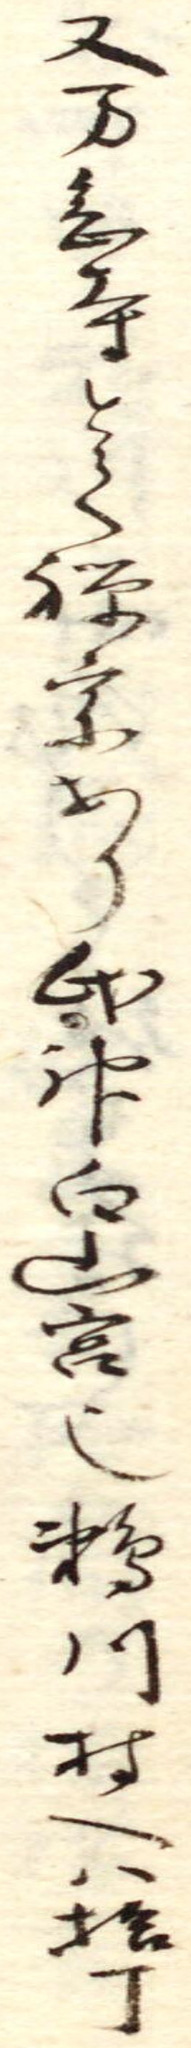又万念寺とて禅宗あり氏神白山宮也鵜川村へは拾丁
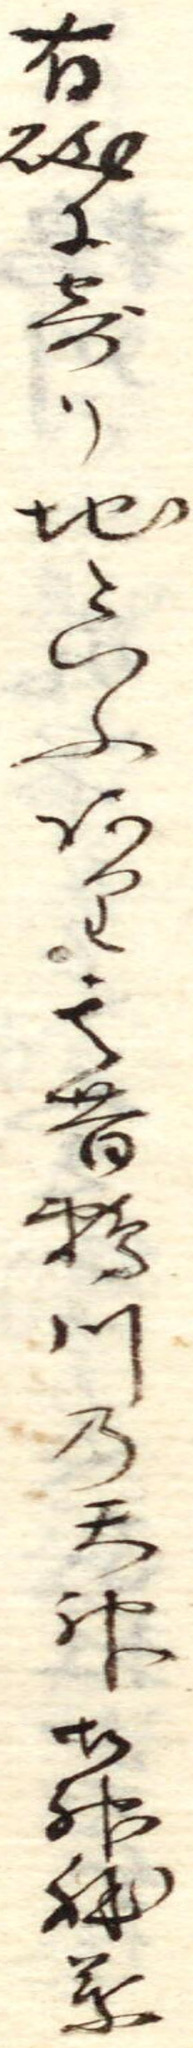有礒に寄り地といふあり其昔鵜川の天神御神躰葉
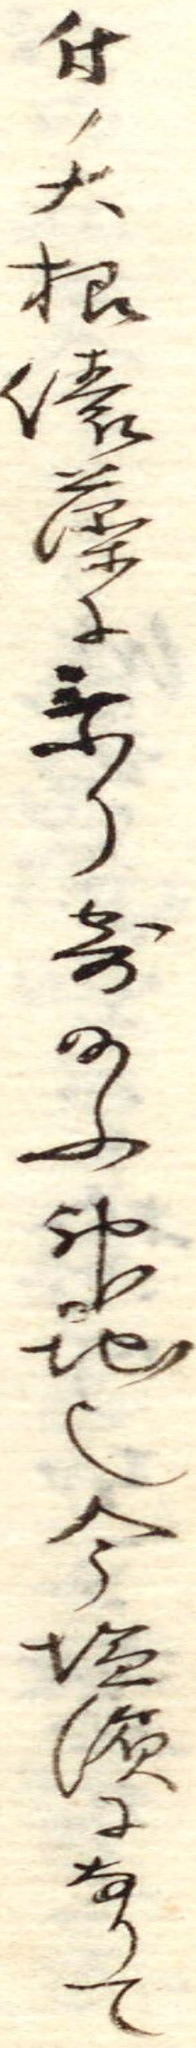付ノ大根俵藻に乗り寄給ふ神地也今塩浜になりて
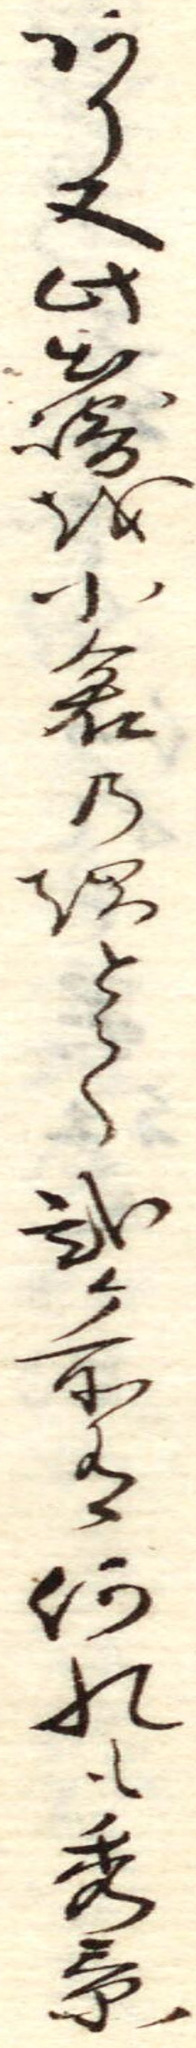あり又此出崎を小倉の端とて弐ヶ所有何れも秀景
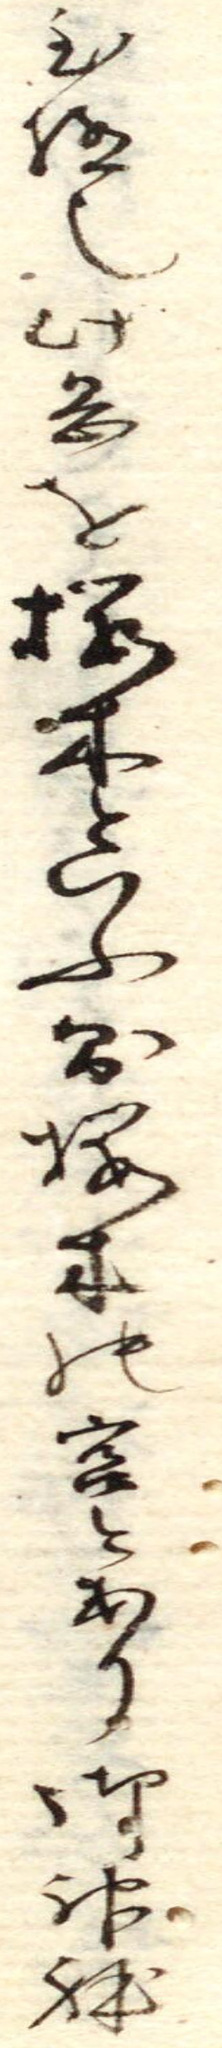至極也此岡を桜木といふ則桜木の宮とあり御神躰
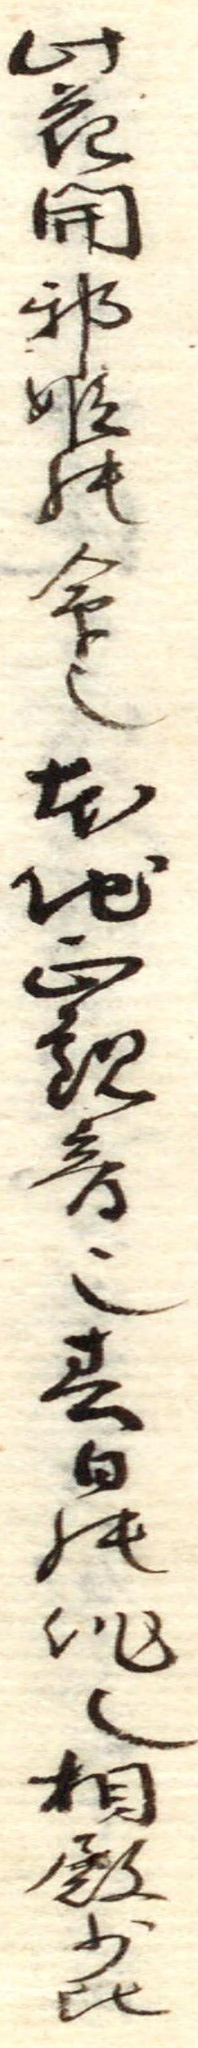此花開邪姫の命也本地正観音也春日の作也相殿少比
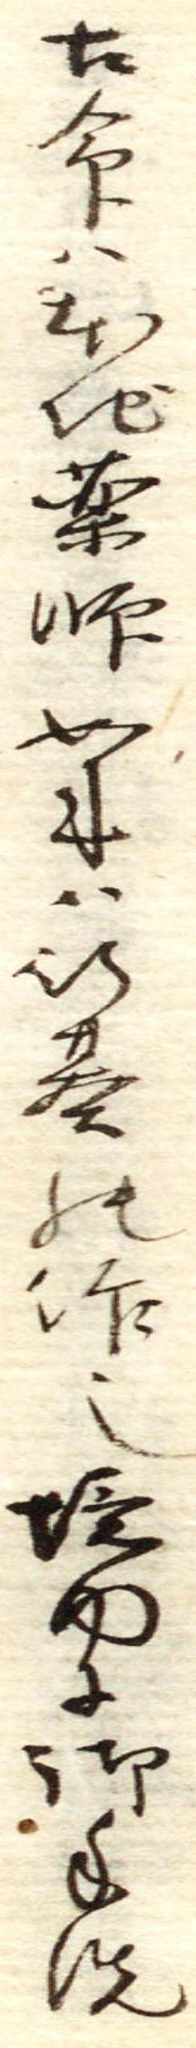古命は本地薬師如来は行基の作也境内に御手洗
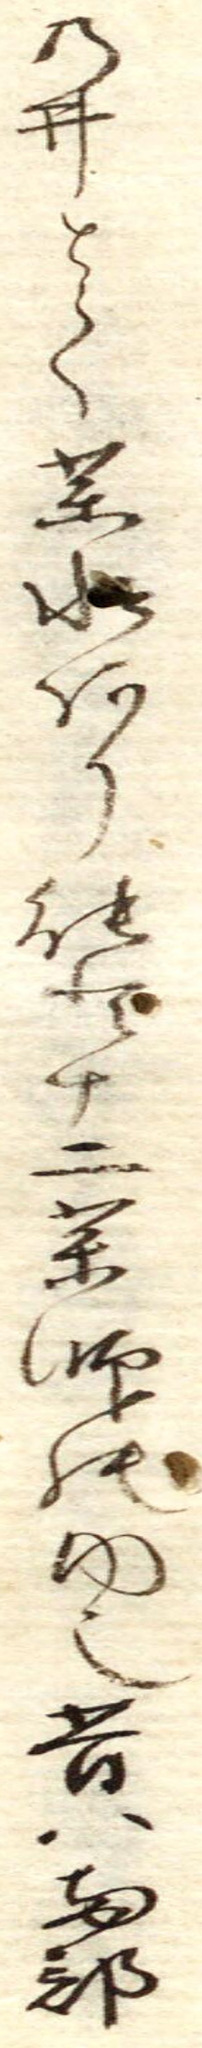の井とて薬帳あり能登十二薬師の内也昔は両部
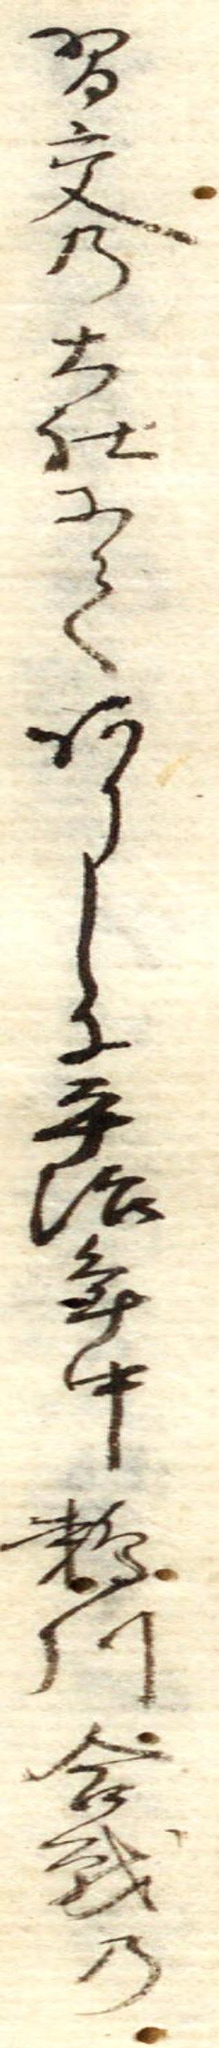習交の大社にてありしに平治年中鵜川合戦の

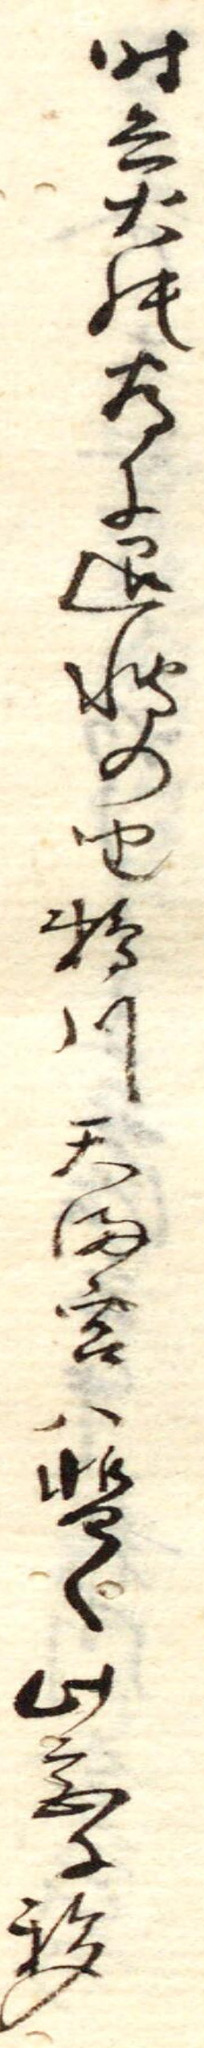時兵火の為に退転の由鵜川天満宮は暫く此宮に移
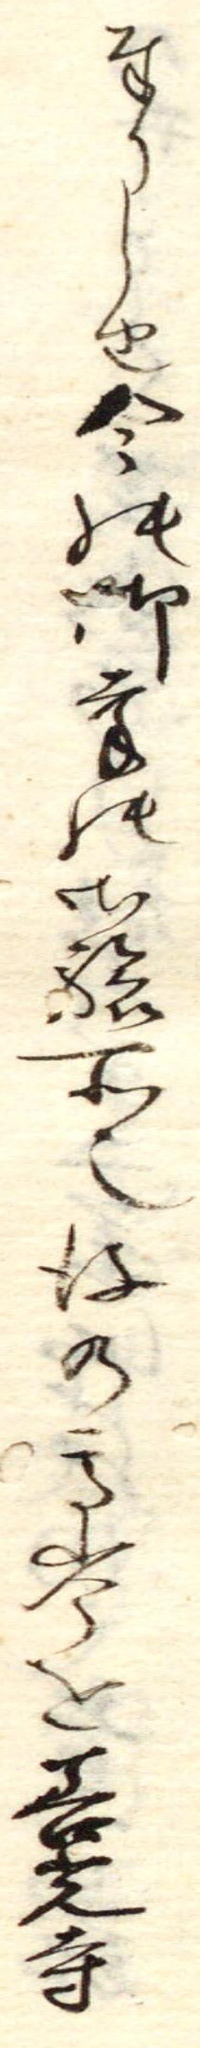奉りし由今の御気の御旅所也後の高岑を善光寺
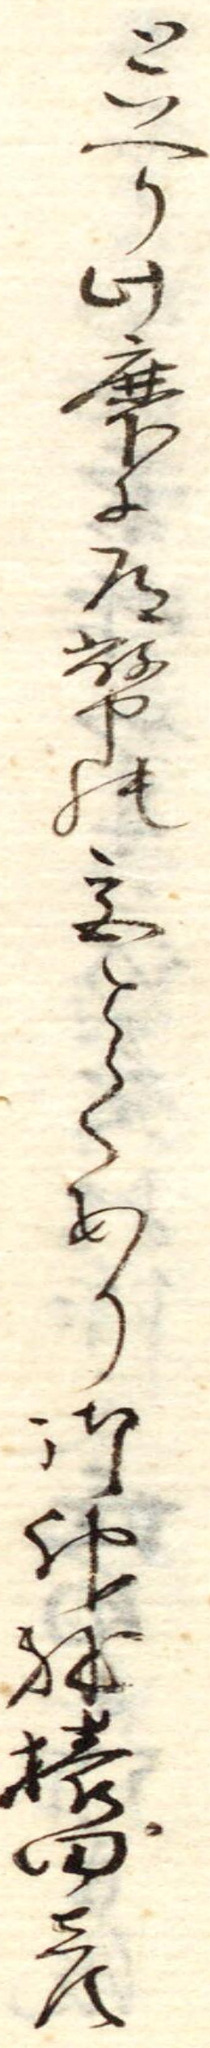といへり此廉下に道幣の宮とてあり御神躰猿田彦
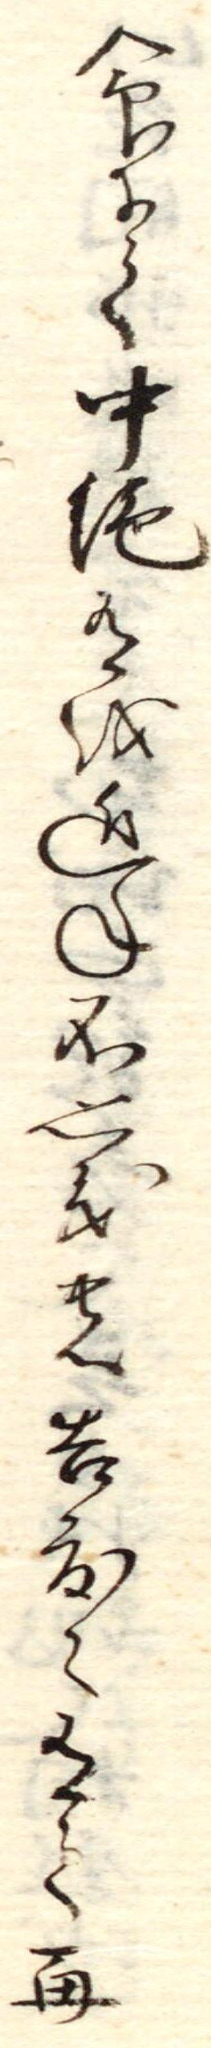命にて中絶有を近年不思義の告度々有て再
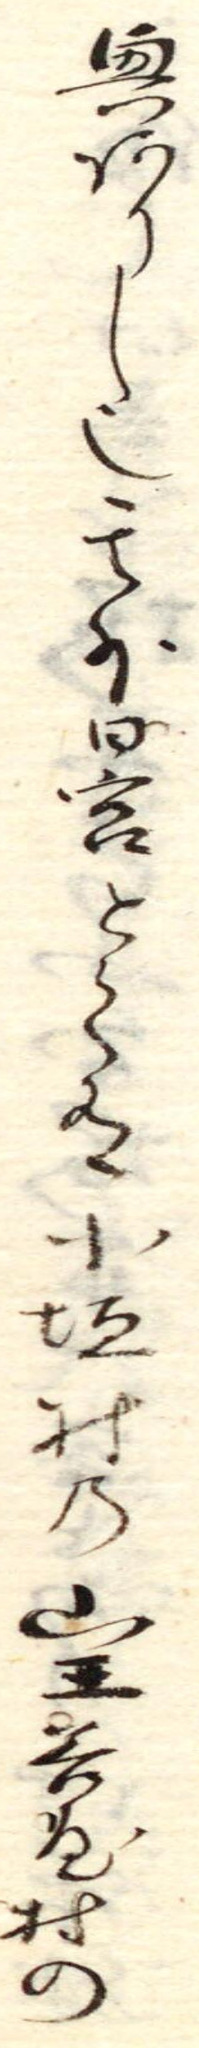興ありし也其外日宮とて有小垣村の山王谷屋村の
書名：能登名跡誌
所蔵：Ishikawa Prefectural Library
